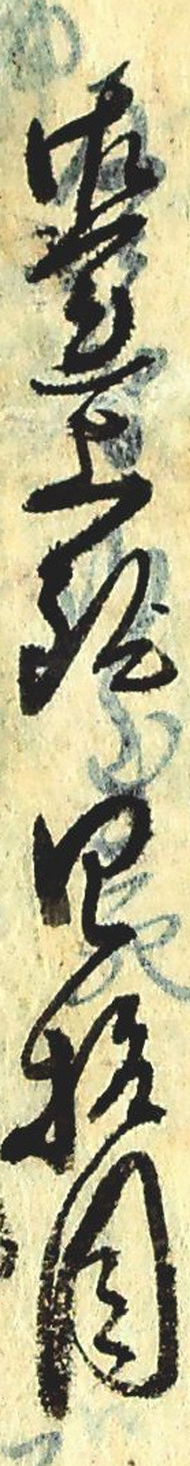御運上銀四拾目
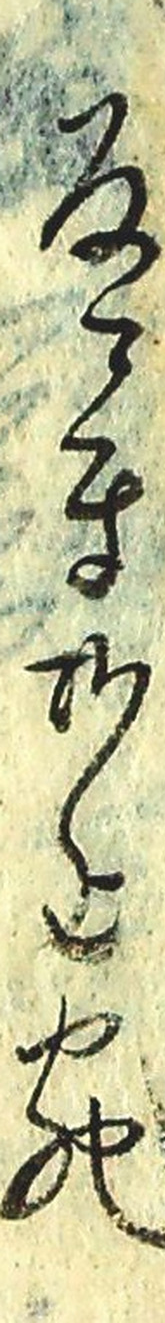反に付弐匁宛
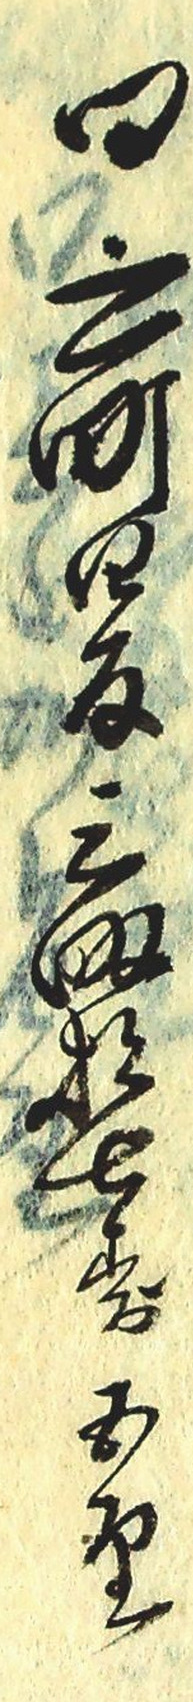同六町四反三畝拾七歩五厘
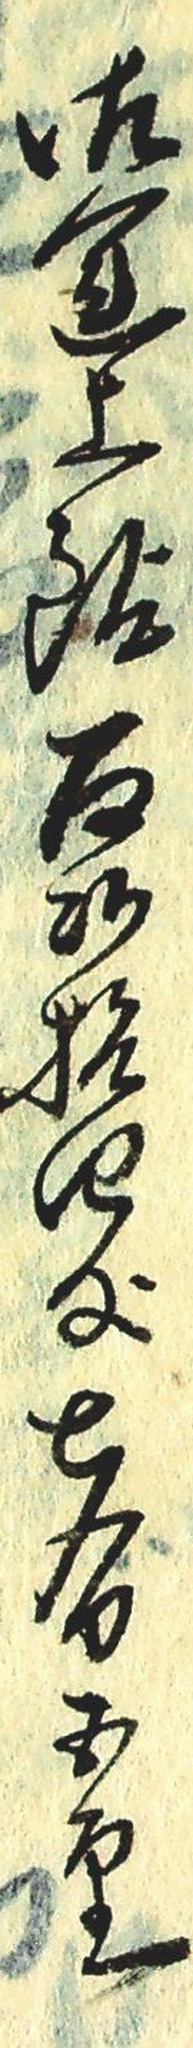御運上銀百弐拾四匁七分五厘
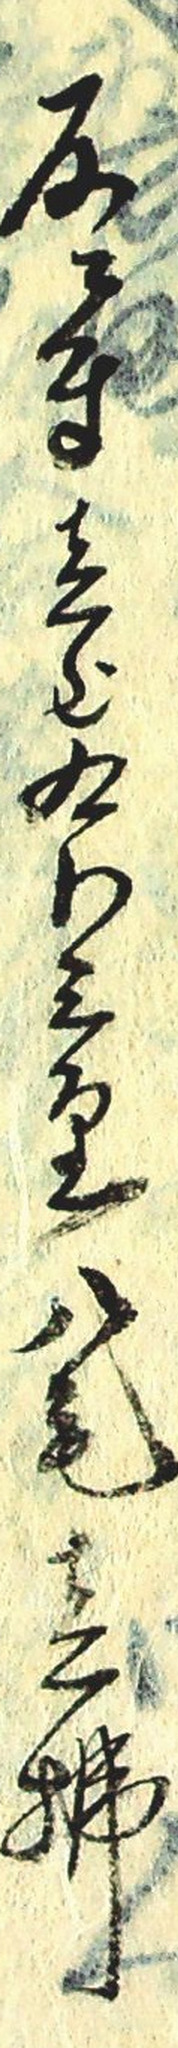反に付壱匁九分三厘八毛壱払
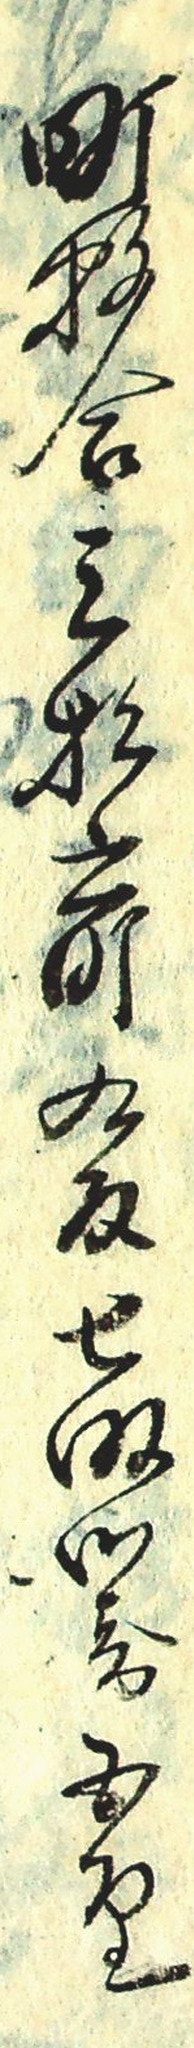町数合三拾六町九反七畝弐歩五厘
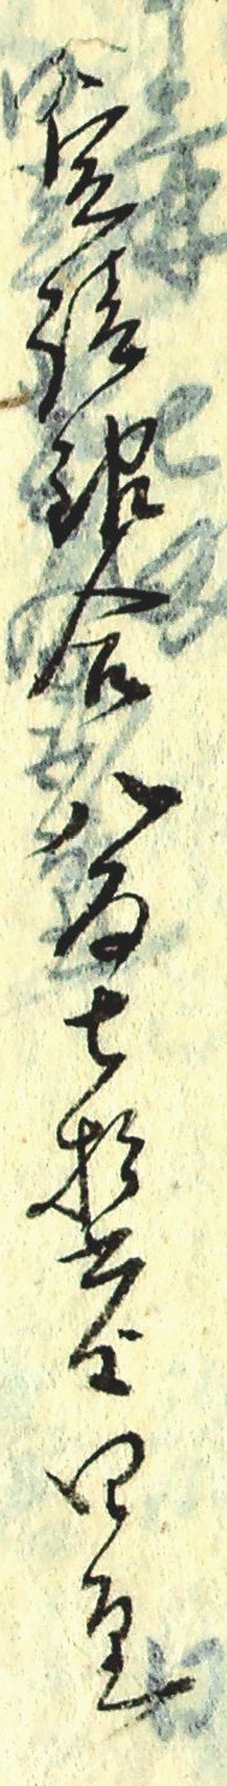定請銀合八百七拾六匁四厘

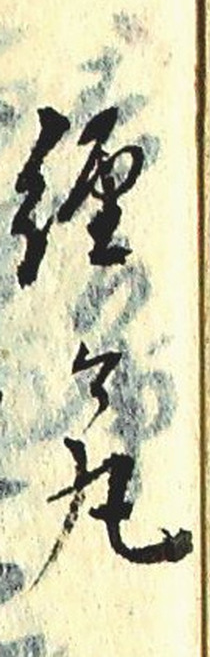経ヶ丸
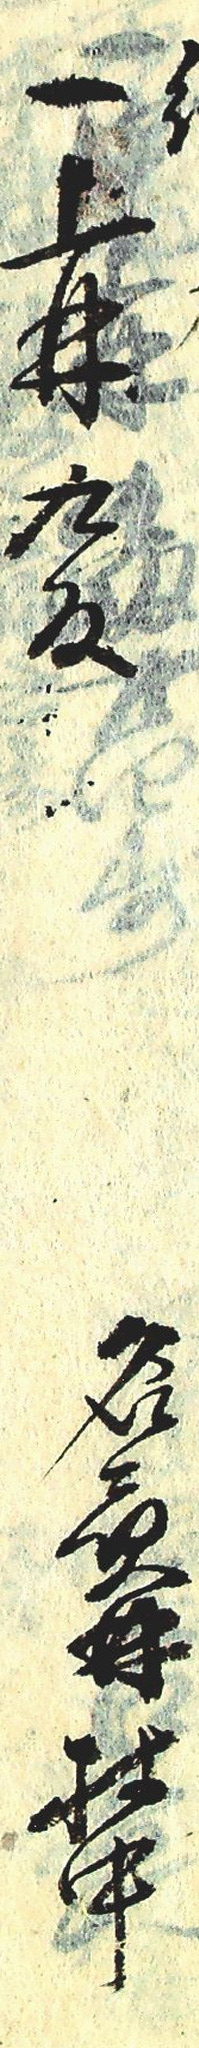一上林九反名負林村中
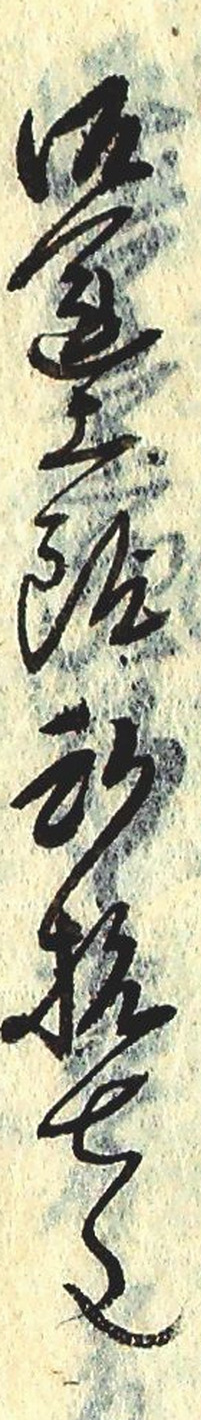御運上銀弐拾七匁
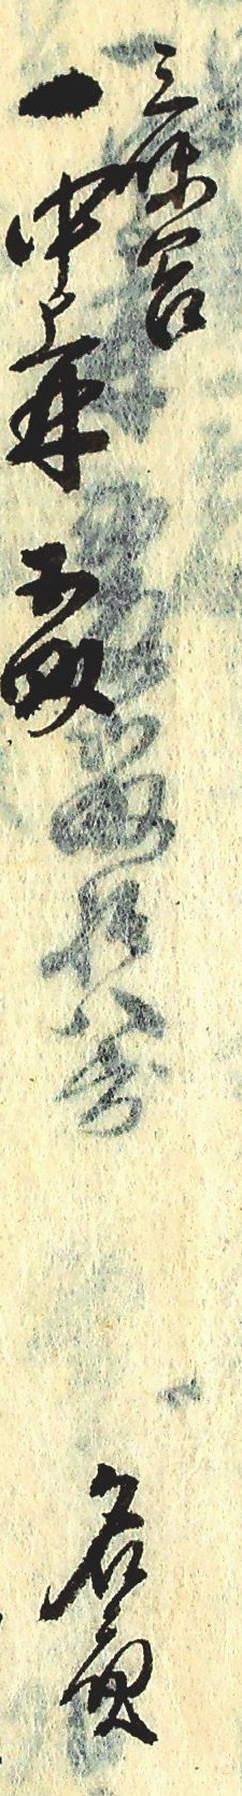一中上林六畝同人
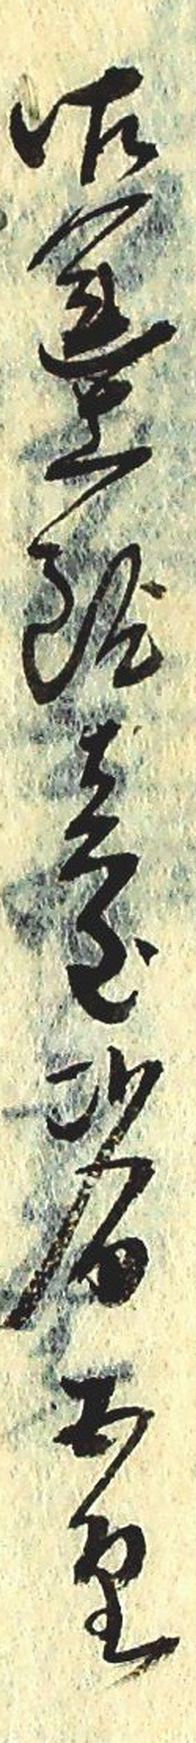御運上銀壱匁弐分五厘
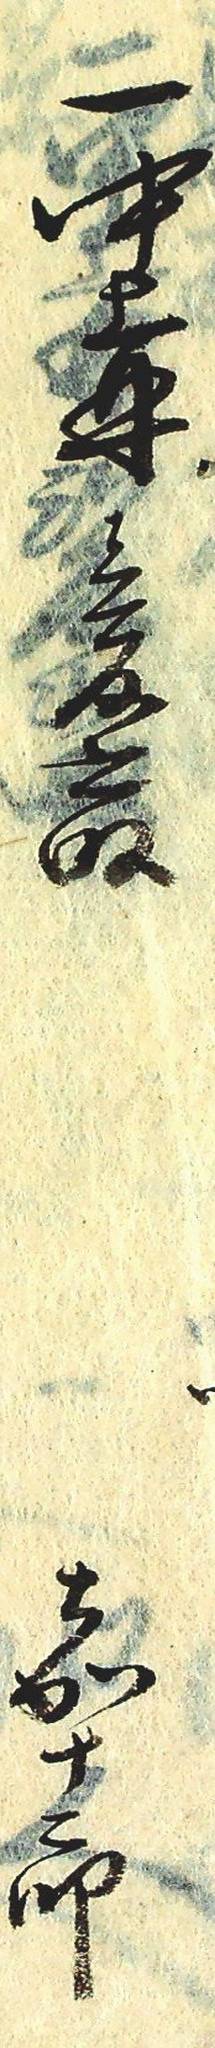一中上林壱反六畝嘉十郎
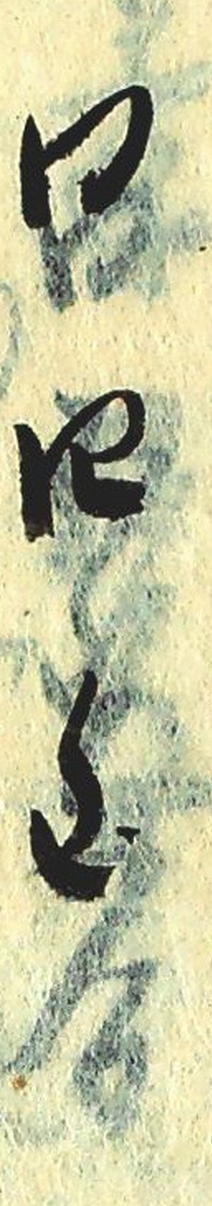同四匁
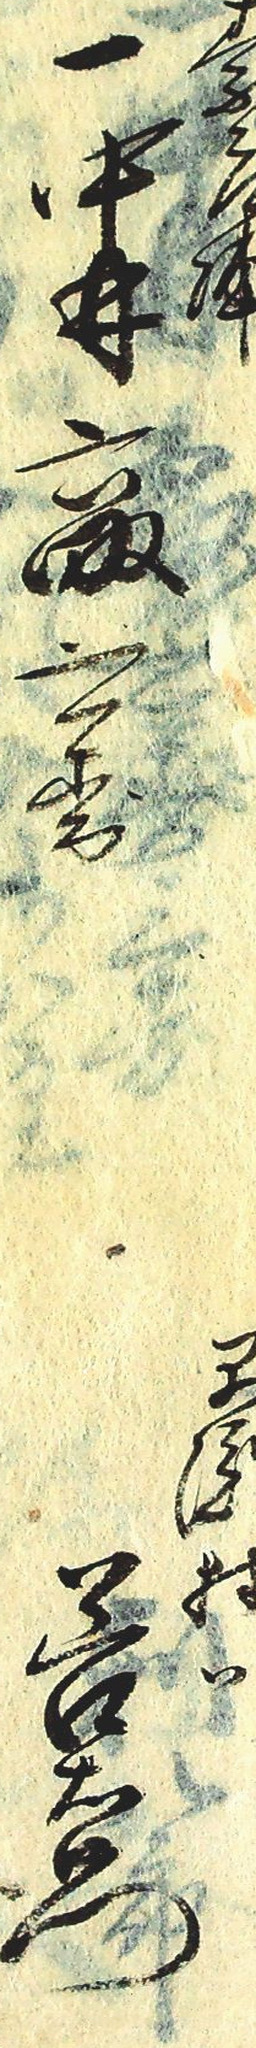一中林六畝六歩善右衛門
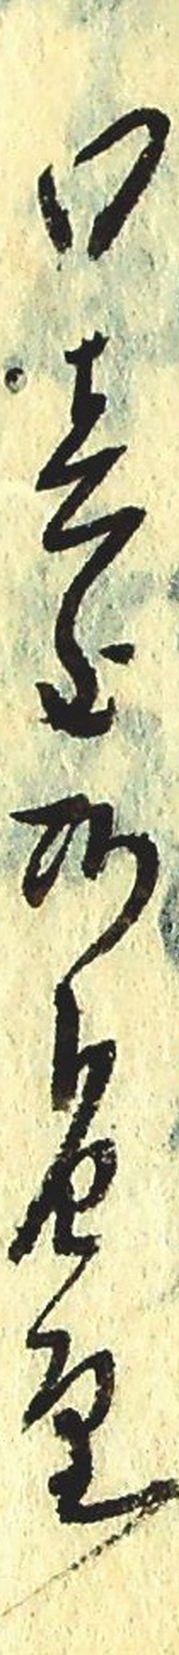同壱匁弐分四厘
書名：諸御願書控(弐番）
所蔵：鳴門教育大学 Naruto University of Education
